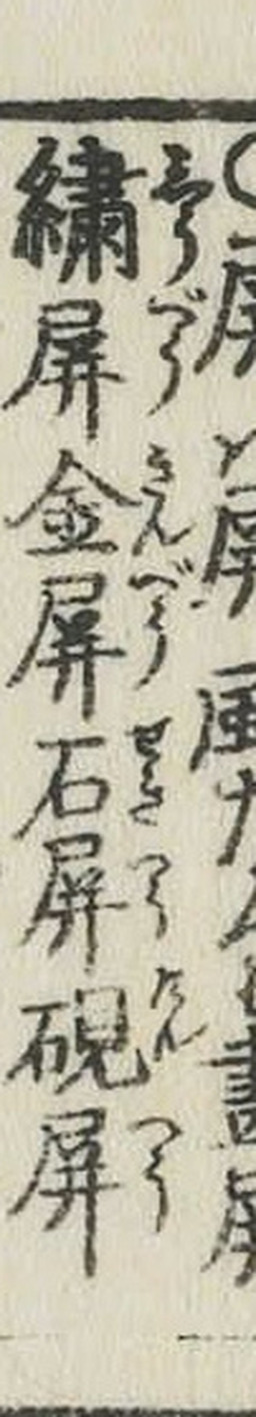繍屏金屏石屏硯屏
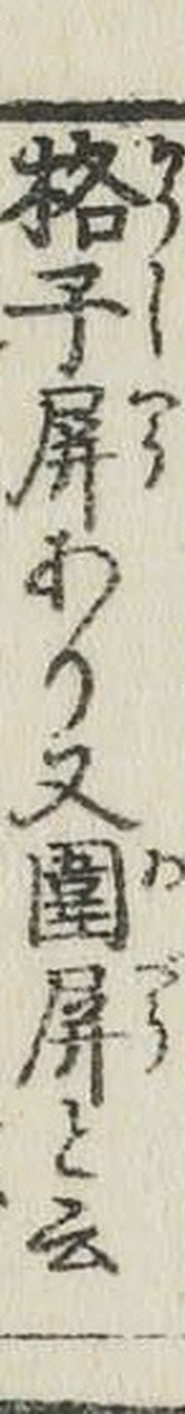格子屏あり又圍屏と云
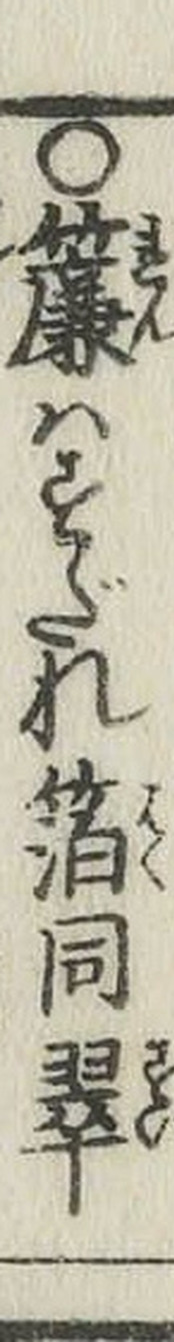○簾はすだれ箔同翠
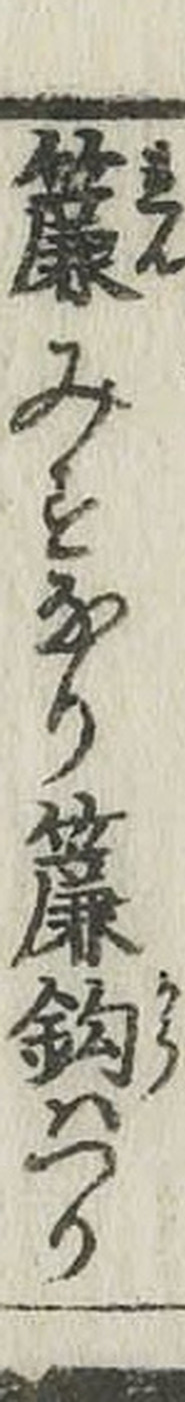簾みすなり簾鈎はつり
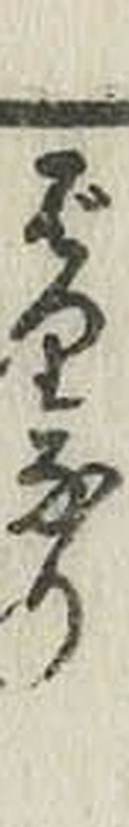ばりなり
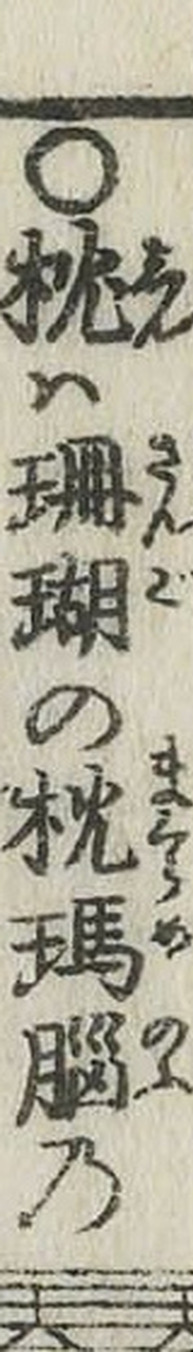○枕は珊瑚の枕瑪瑙の
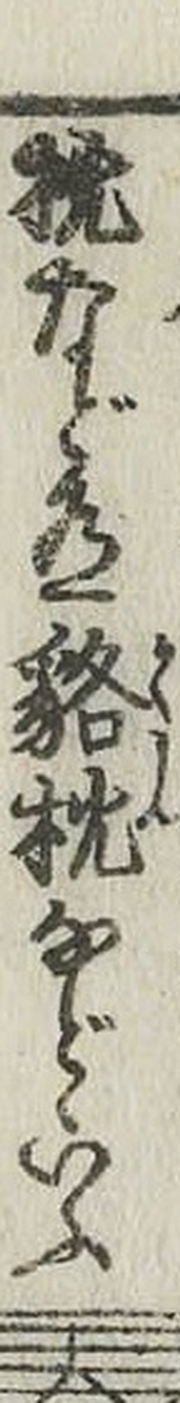枕など有貉枕などゝいふ
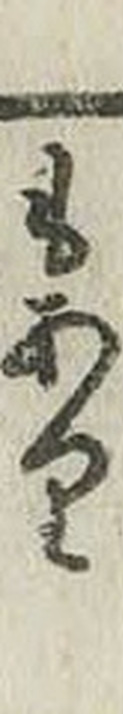もあり
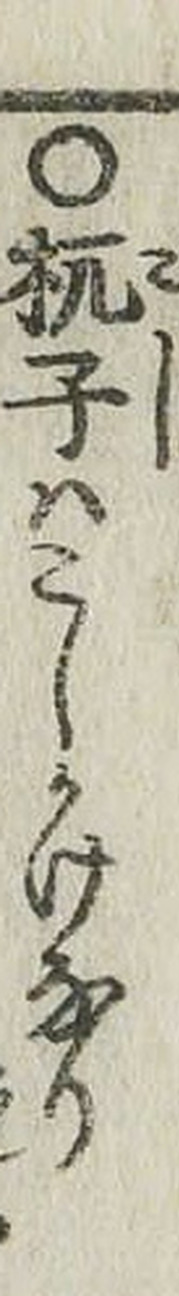○杌子はこしかけなり
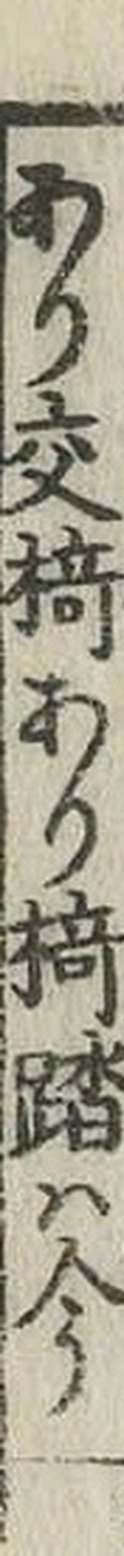あり交椅あり椅踏は今
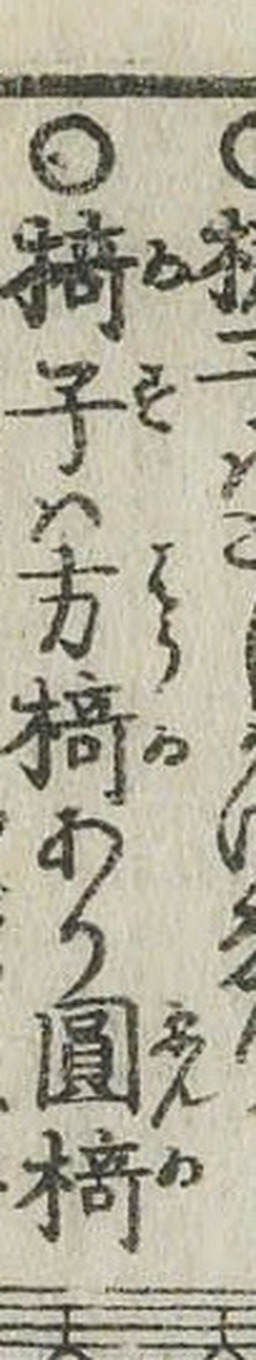○椅子は方椅あり円椅

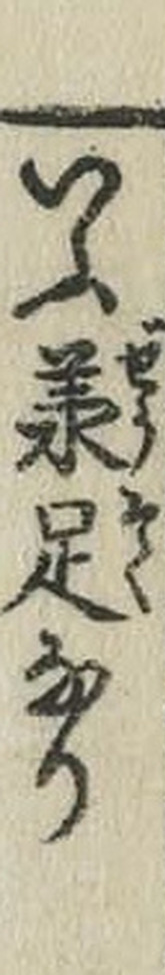いう承足なり
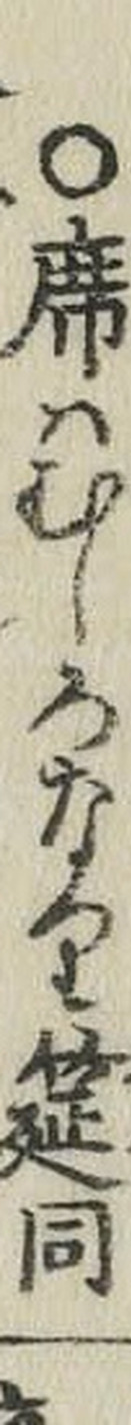○席はむしろなり筵同
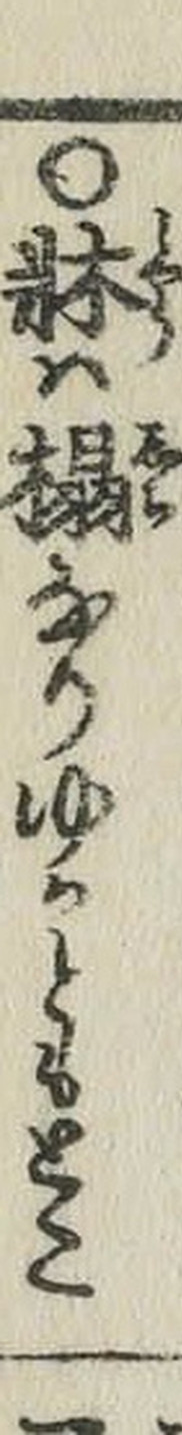○牀は榻なりゆかともとこ
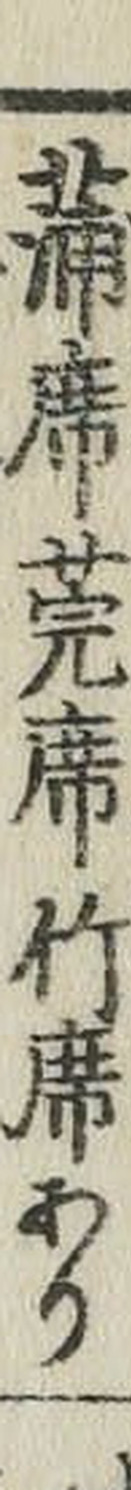蒲席莞席竹席あり
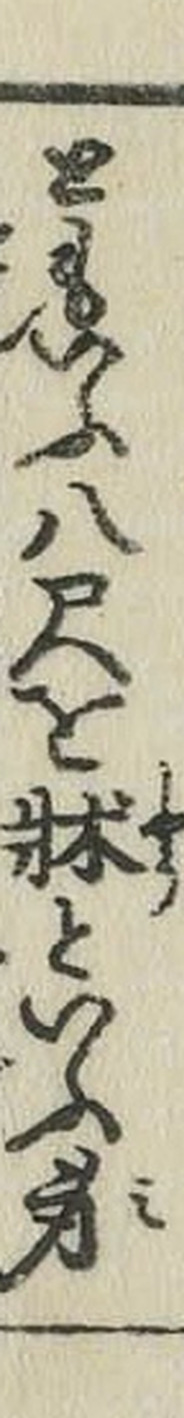ともいふ八尺を牀といふ身
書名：増補頭書訓蒙図彙大成 10巻 5:巻之9-11
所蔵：東京学芸大学教育コンテンツアーカイブ
